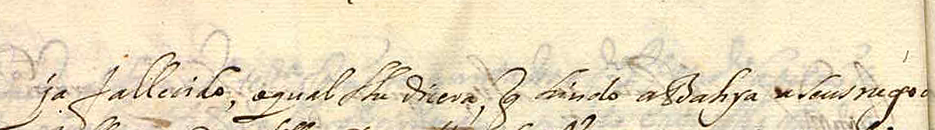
ja fallecido, o qual lhe dizera, q̄ hindo a Bahya a seus negoc
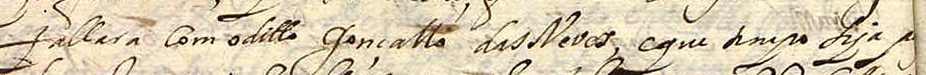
fallara Com o ditto Gonçallo das Neves, e que tempo seja, p
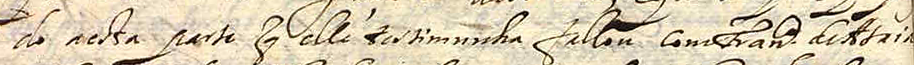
do a esta parte q̄ elle testimunha fallou com Franco. de Atai
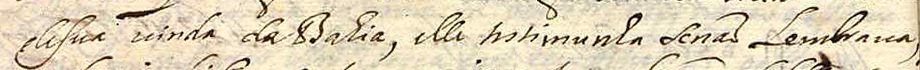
de sua uinda da Bahia, elle testimunha senaõ Lembraua,
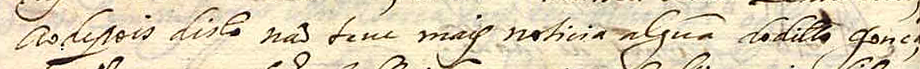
ao depois disto naõ teue mais noticia alguā do ditto gonca
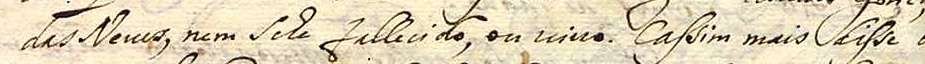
das Neues, nem se he fallecido, ou uiuo. E assim mais disse
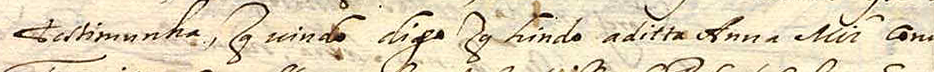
testimunha, q̄ uindo digo q̄ hindo a ditta Anna Miz̄ con
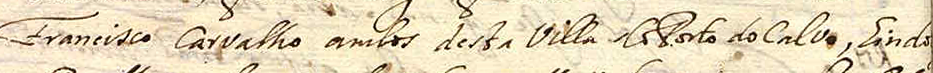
Francisco Carvalho ambos desta Villa do Porto do Calvo, hindo
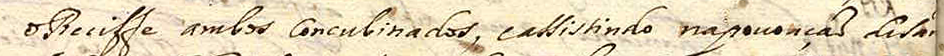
o Reciffe ambos concubinados, e assistindo na pouoaçaõ de san
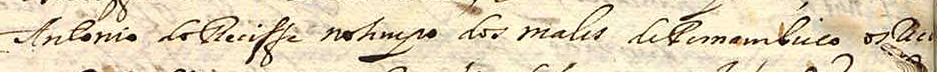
Antonio do Reciffe no tempo dos males de Pernambuco os Rec
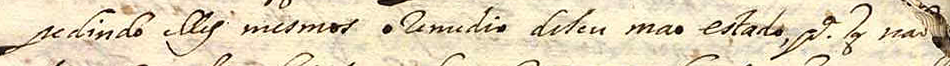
pedindo elles mesmos o Remedio de seu mao estado, p.a q̄ naõ
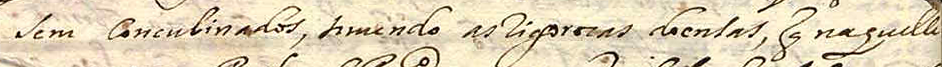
sem concubinados, temendo as Rigorozas doensas, q̄ naquelle
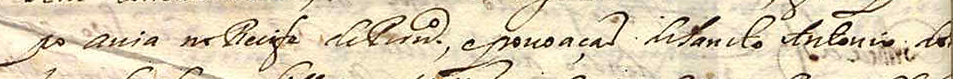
po auia no Recife de Pern.co, e pouoaçaõ de Sancto Antonio dos
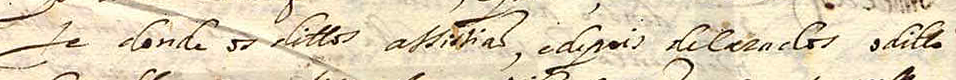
te donde os dittos assistiaõ, e depois de cazados o ditto
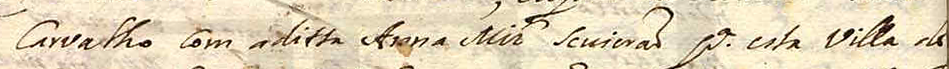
Carvalho com a ditta Anna Miz̄ se uierão p.a esta villa do
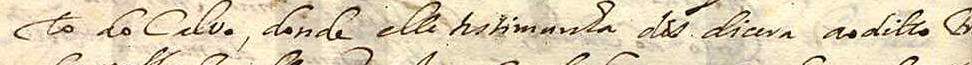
to do Calvo, donde elle testimunha desdicera ao ditto Fr
